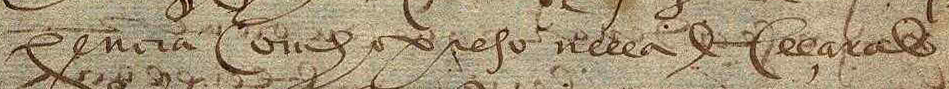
gencia Com ho preso nella deCllarado
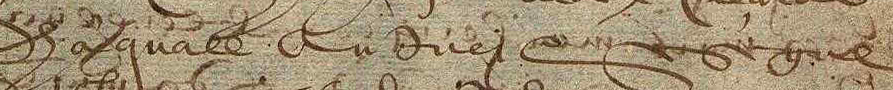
ho quall autuej e Se segue
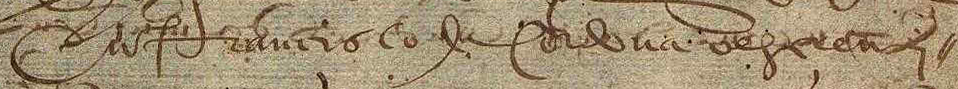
Eu francisco de Cordoua o escreuj //
